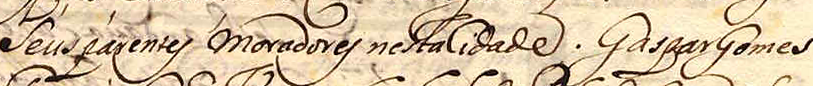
seus parentes moradores nesta Cidade. Gaspar Gomes
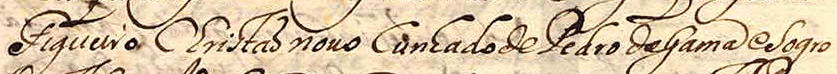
Figueiro Christaõ nouo Cunhado de Pedro da Gama e sogro
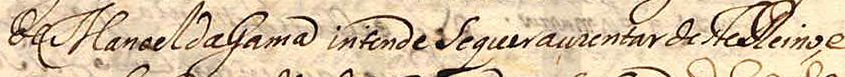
de Manoel da Gama intende Se quer auzentar deste Reino, e
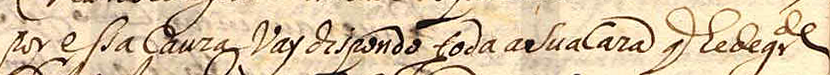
por essa cauza Vay dispondo toda a sua caza q̄ he de grde
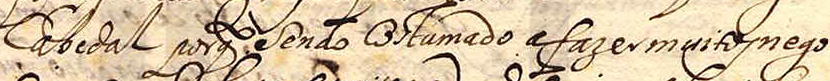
Cabedal porqto sendo costumado a fazer muitos nego
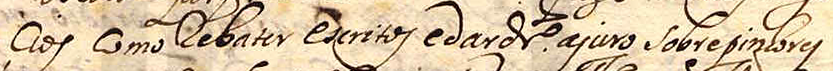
cios como Rebater escritos e dar dr.o a juro sobre pinhores
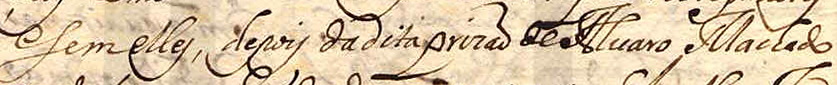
e sem elles, depois da dita prizaõ de Aluaro Machado
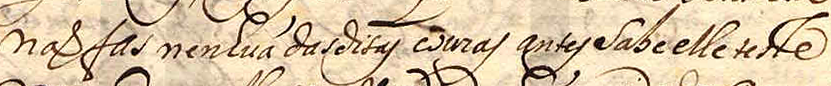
naõ fas nenhuā das ditas couzas antes sabe elle teste
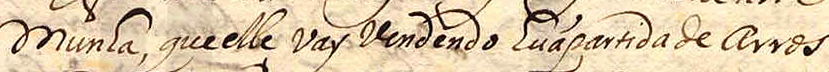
munha, que elle vay vendendo huā partida de arros
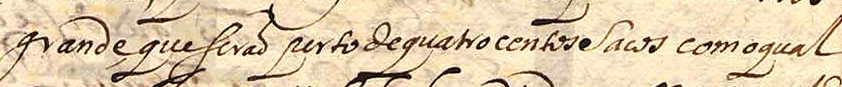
grande, que seraõ perto de quatrocentos sacos com o qual
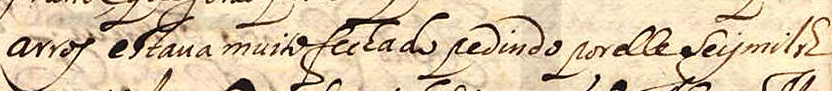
arros estaua muito fechado pedindo por elle seis mil rs̄
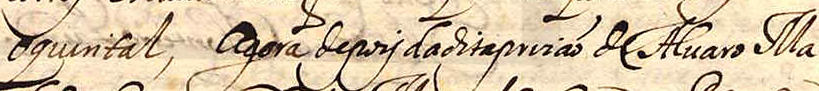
o quintal, agora depois da dita prizaõ de Aluaro Ma
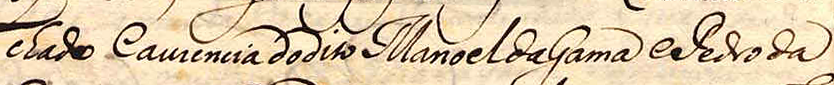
chado e auzencia do dito Manoel da Gama e Pedro da
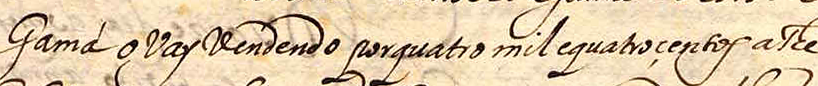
Gama o vay vendendo por quatro mil e quatrocentos athe
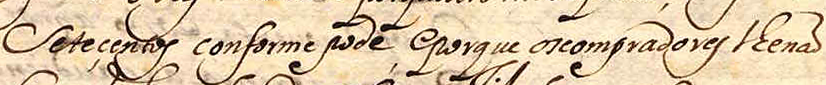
Setecentos conforme pode, e porque os compradores lhe naõ
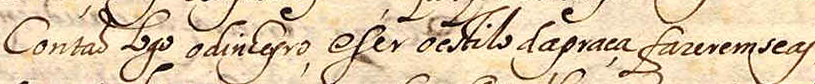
Contaõ Logo o dinheyro, e ser o estilo da praça fazerem se as
